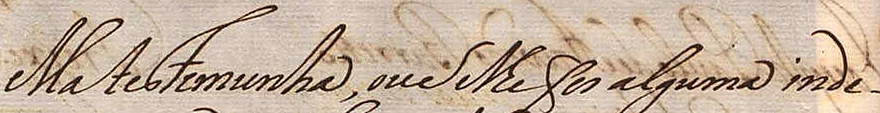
ella testemunha, ou Se lhe fes alguma inde
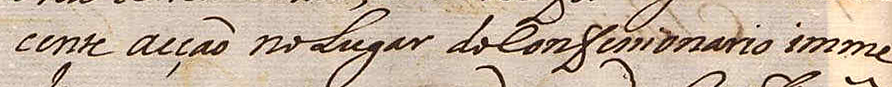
cente acção no Lugar do Confessionario imme
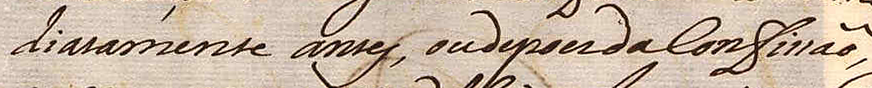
diatamente antes, ou depoes da Confissaõ,
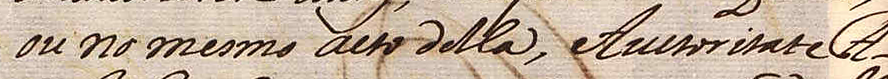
ou no mesmo acto della, Auctoritate A
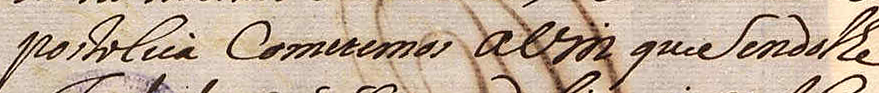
postolica Cometemos a V M que sendolhe
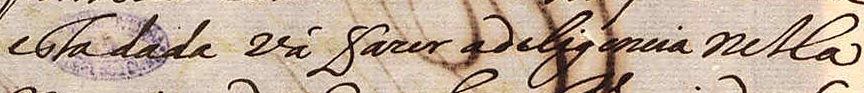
esta dada vá fazer a deligencia nella
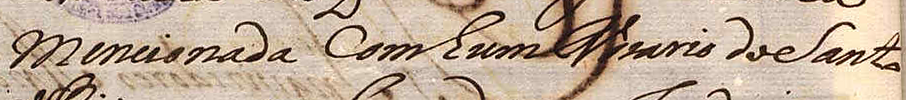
mencionada com hum Notario do Santo
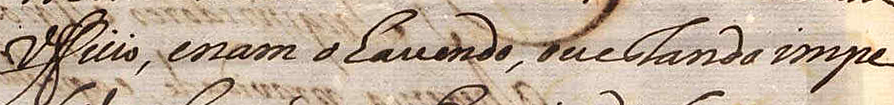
Officio, e nam o hauendo, ou estando impe
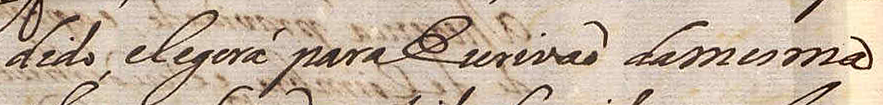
dido, elegerá para Escrivaõ da mesma
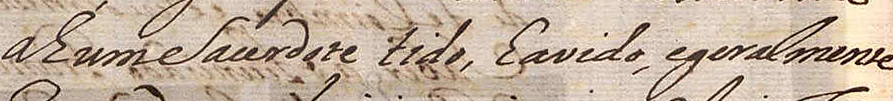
a hum Sacerdote tido, havido, e geralmente
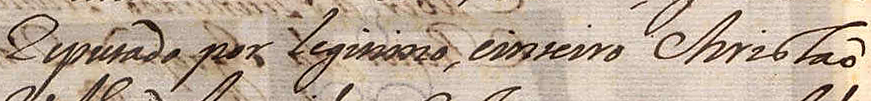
Reputado por legitimo, e inteiro christaõ
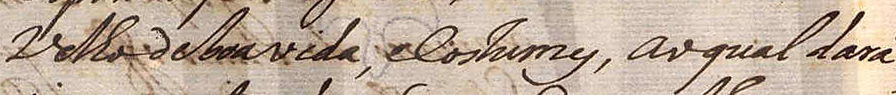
Velho de boa vida, e Costumes, ao qual dará
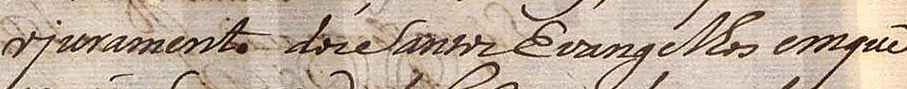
o juramento dos Santos Evangelhos em que
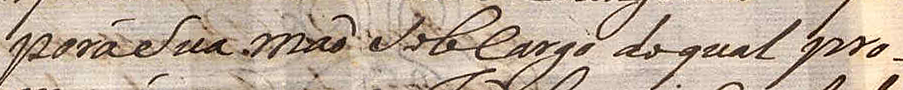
porá Sua maõ sob cargo do qual pro
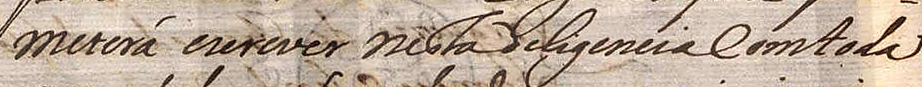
meterá escrever nesta deligencia Com toda
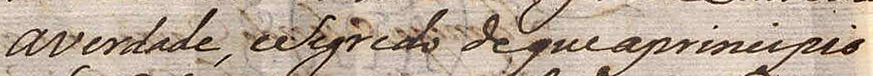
a verdade, e Segredo de que a principio
